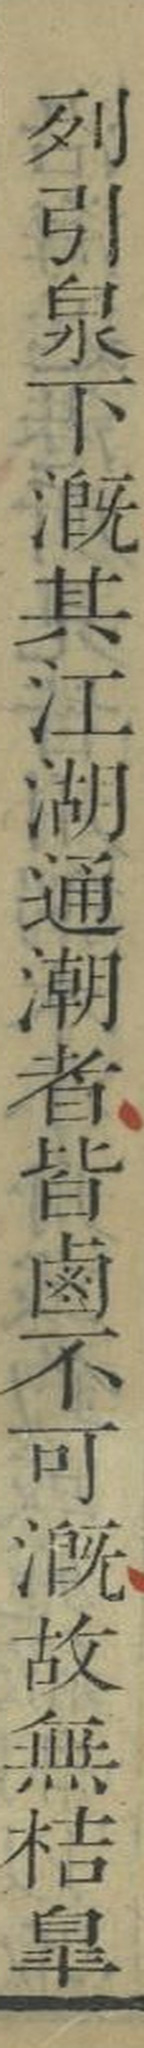列引泉下漑其江湖通潮者皆鹵不可漑故無桔皐
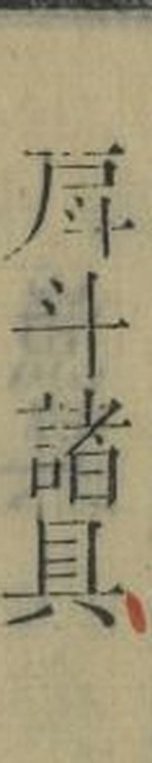戽斗諸具
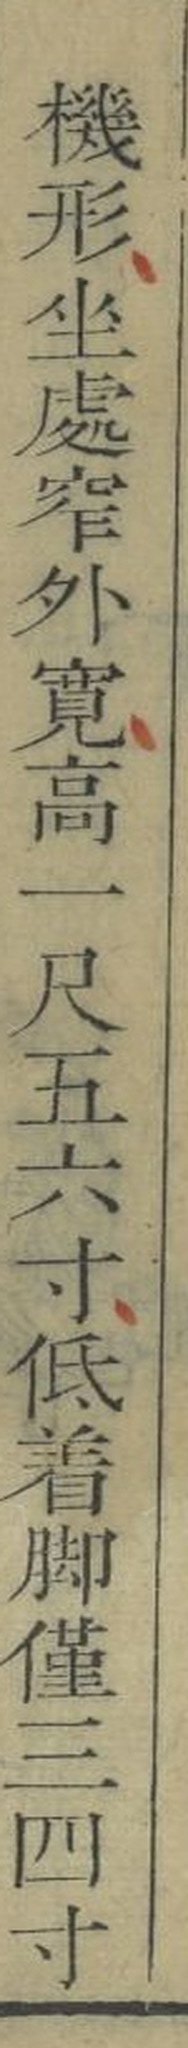機形坐処窄外寛高一尺五六寸低着脚僅三四寸
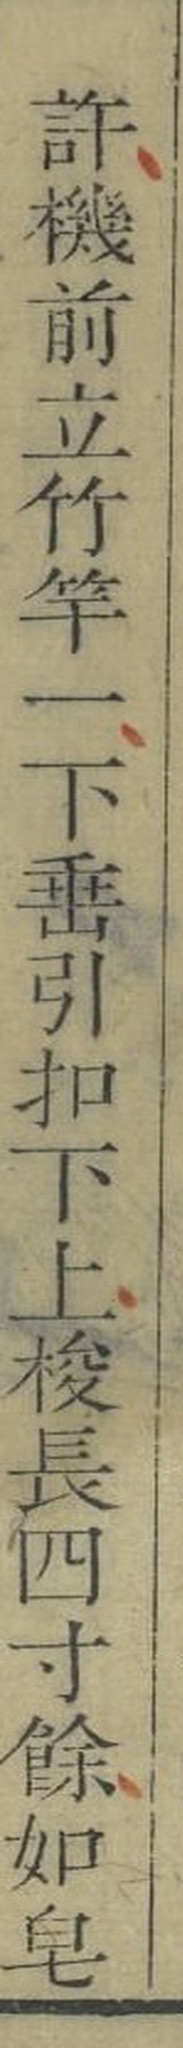許機前立竹竿一下垂引扣下上梭長四寸余如皂
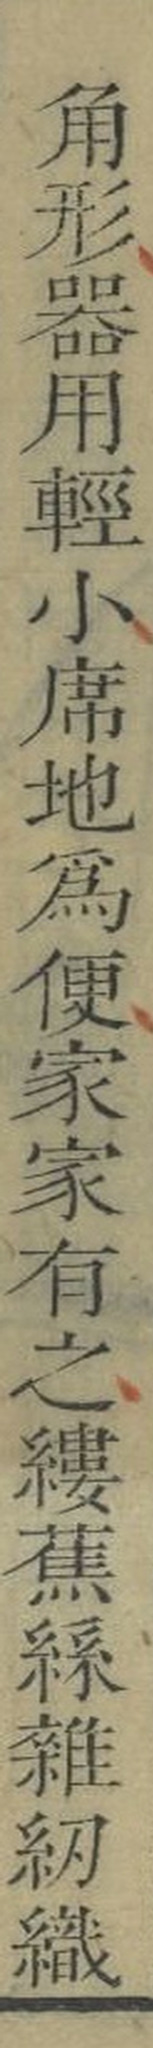角形器用軽小席地為便家家有之縷蕉糸雑紉織

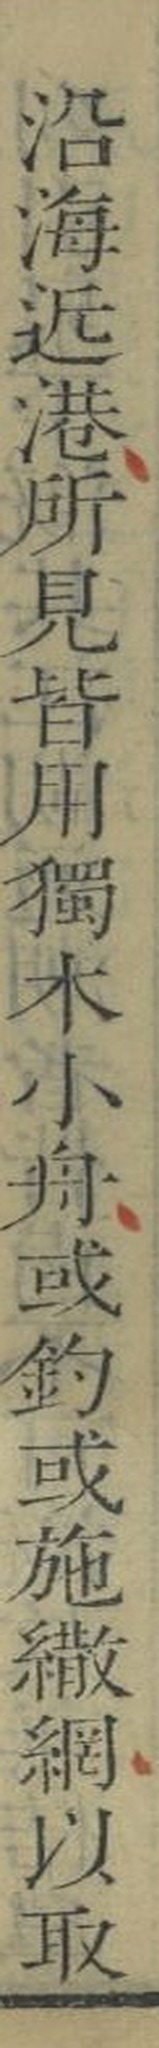沿海近港所見皆用独木小舟或釣或施繖網以取
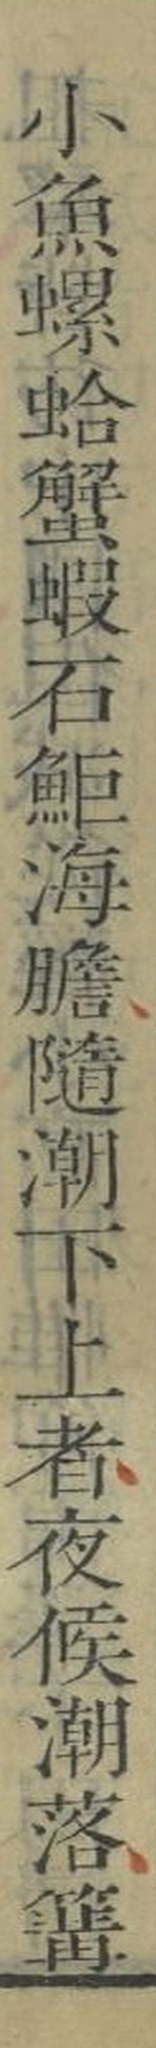小魚螺蛤蟹蝦石鮔海胆随潮下上者夜候潮落篝
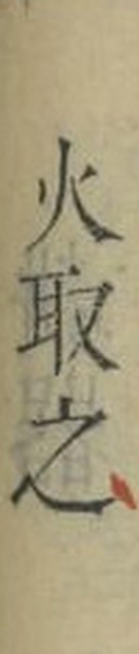火取之
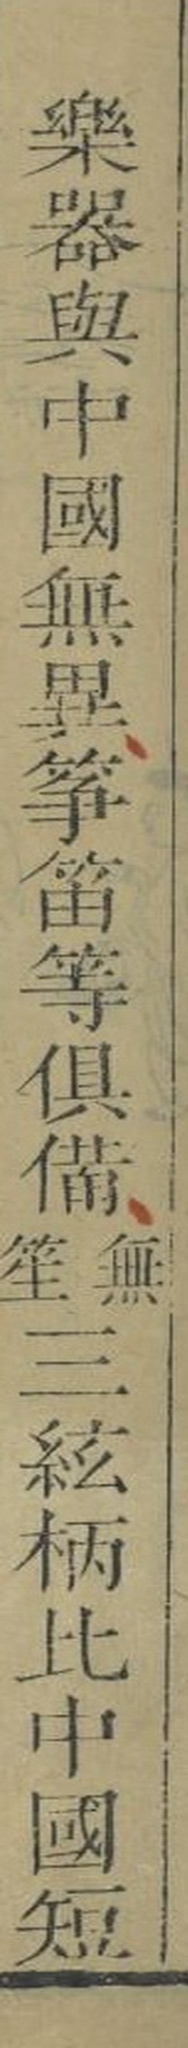楽器与中国無異筝笛等俱備無笙三絃柄比中国短
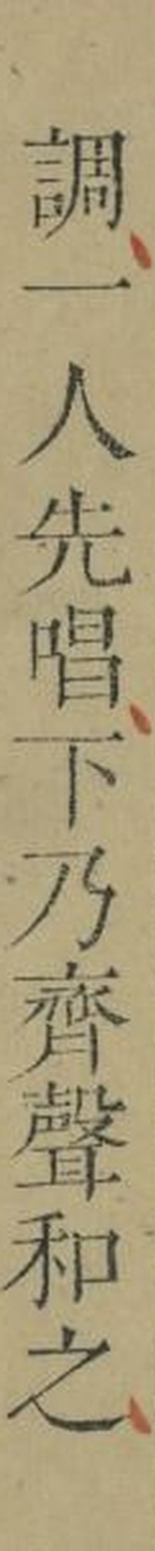調一人先唱下乃斉声和之
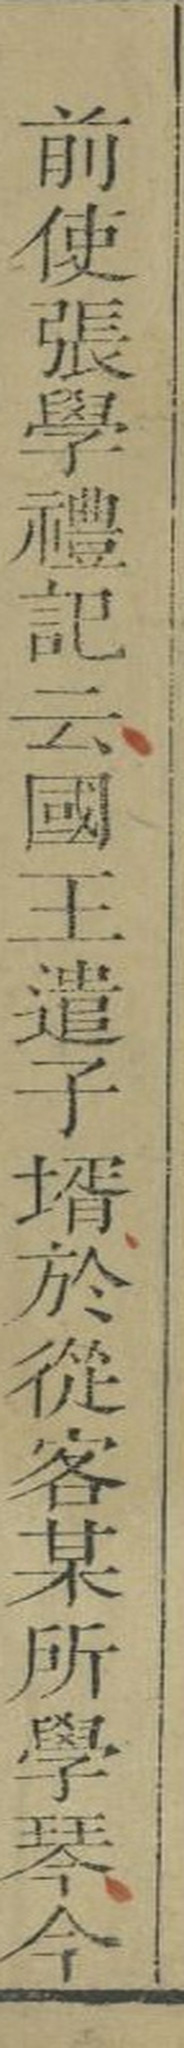前使張学礼記云国王遣子婿於従客某所学琴今
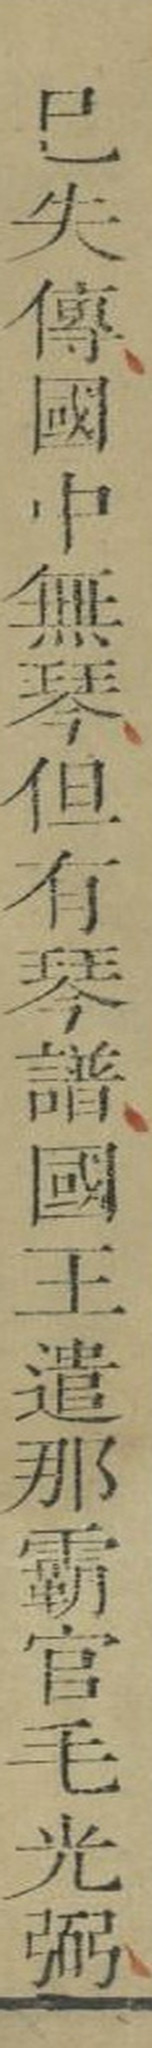巳失伝国中無琴但有琴譜国王遣那霸官毛光弼
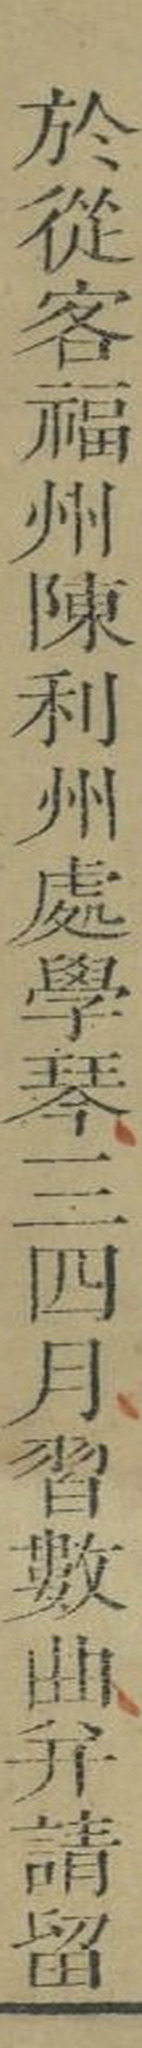於従客福州陳利州処学琴三四月習数曲幷請留
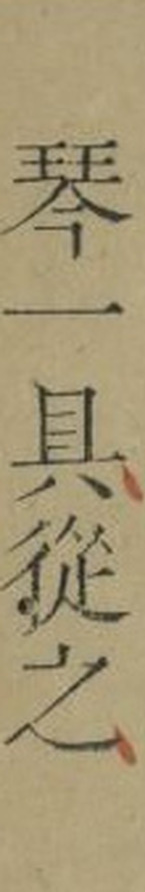琴一具従之

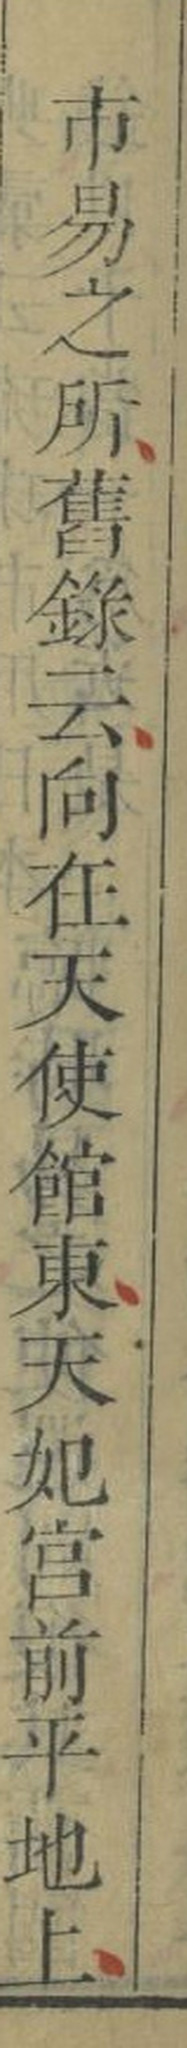市易之所旧録云向在天使館東天妃宮前平地上
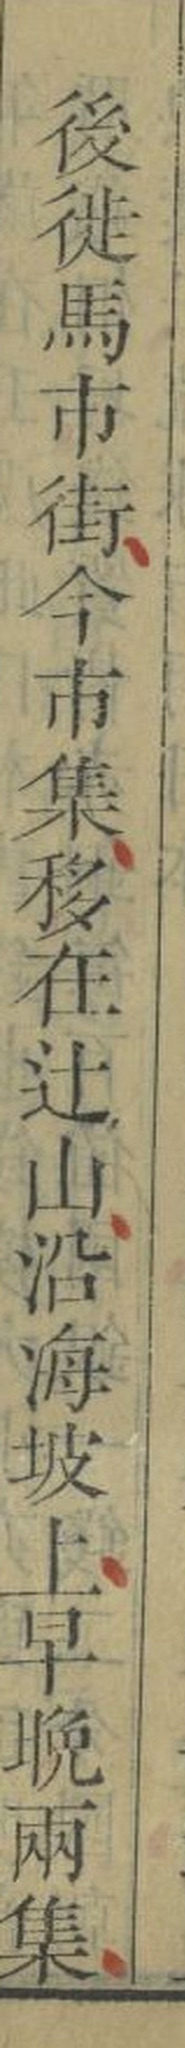後徙馬市街今市集移在辻山沿海坡上早晩両集
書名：中山伝信録 巻六
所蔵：University of the Ryukyus Library
